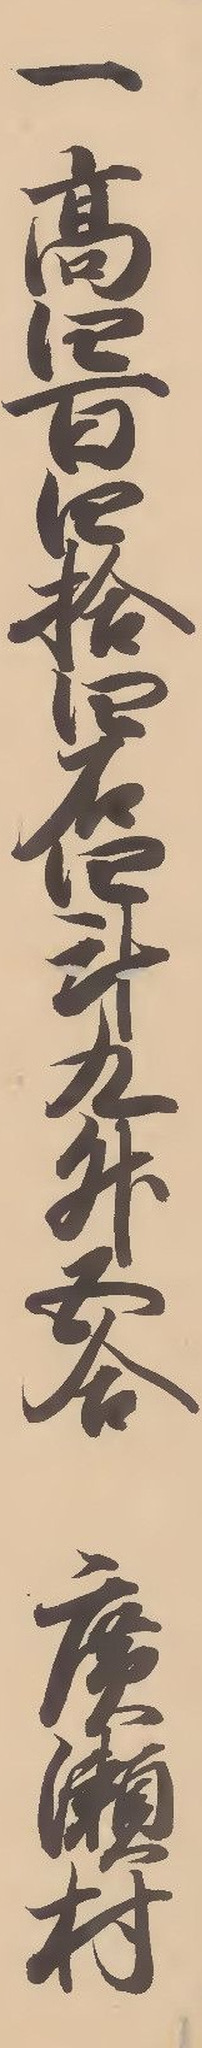一高四百四拾四石四斗九升五合広瀬村
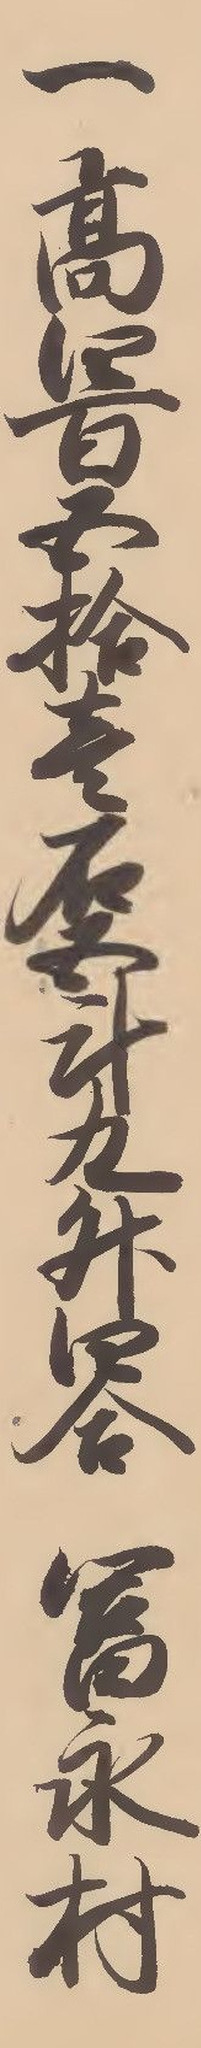一高四百五拾壱石五斗九升四合富永村
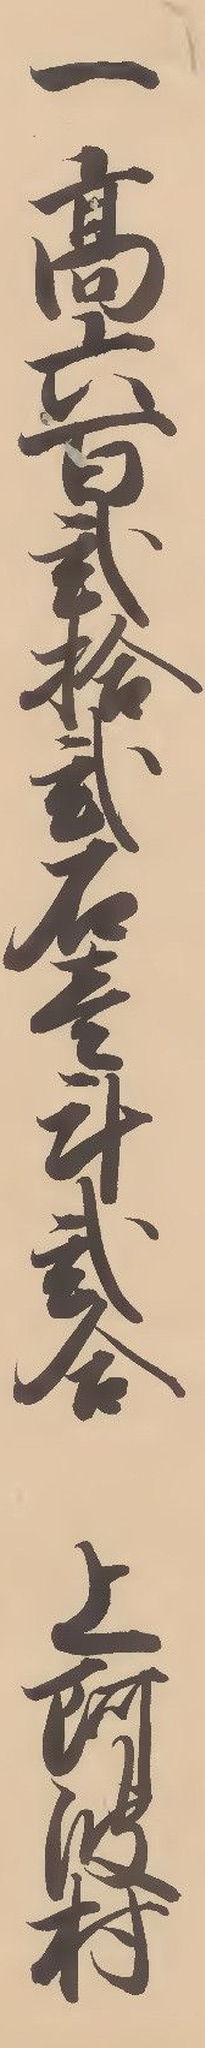一高六百弐拾弐石壱斗弐合上阿波村
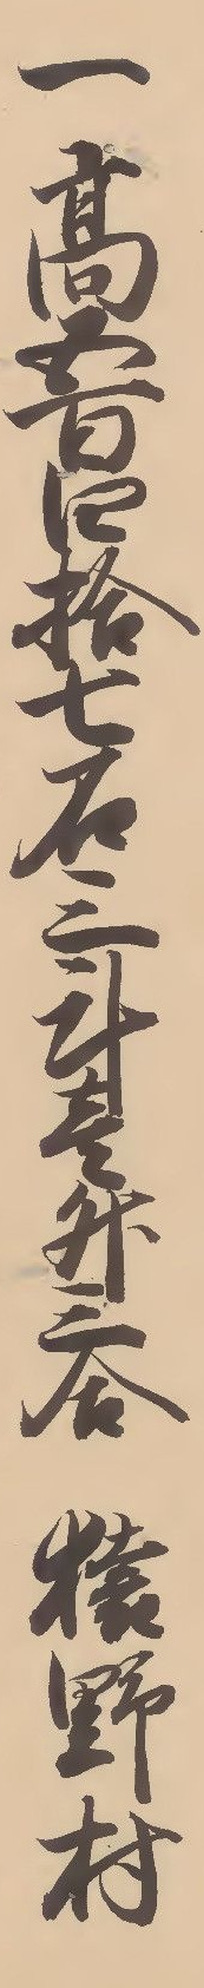一高五百四拾七石三斗壱升三合猿野村

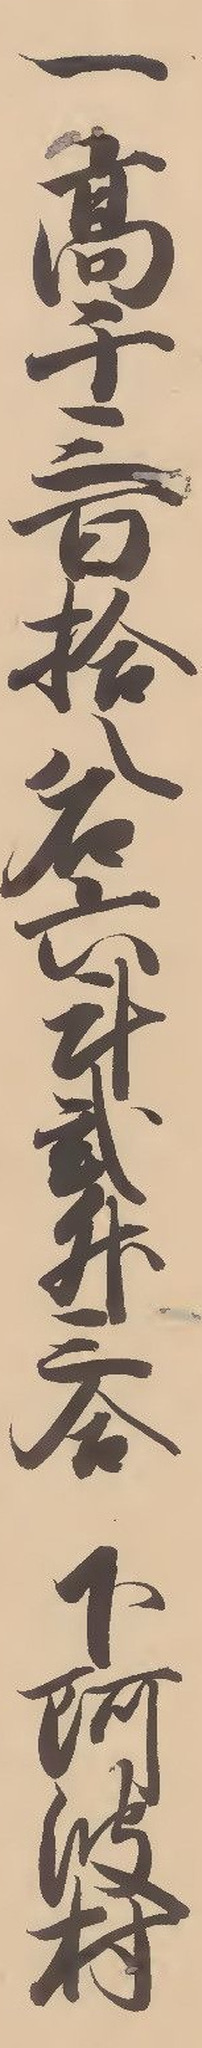一高千三百拾八石六斗弐升三合下阿波村
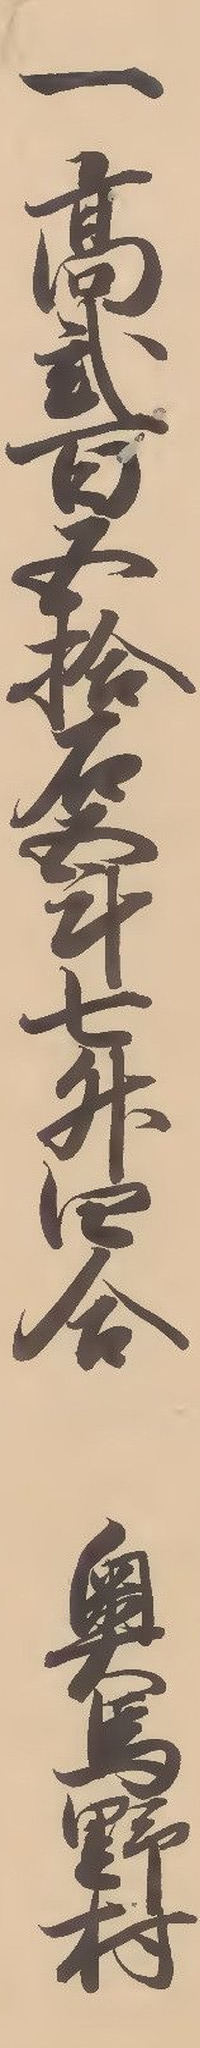一高弐百五拾石五斗七升四合奥馬野村
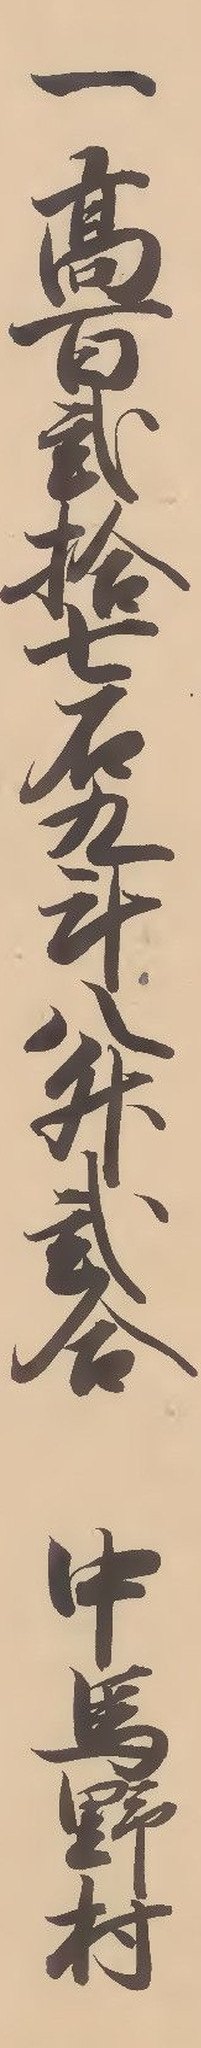一高百弐拾七石九斗八升弐合中馬野村
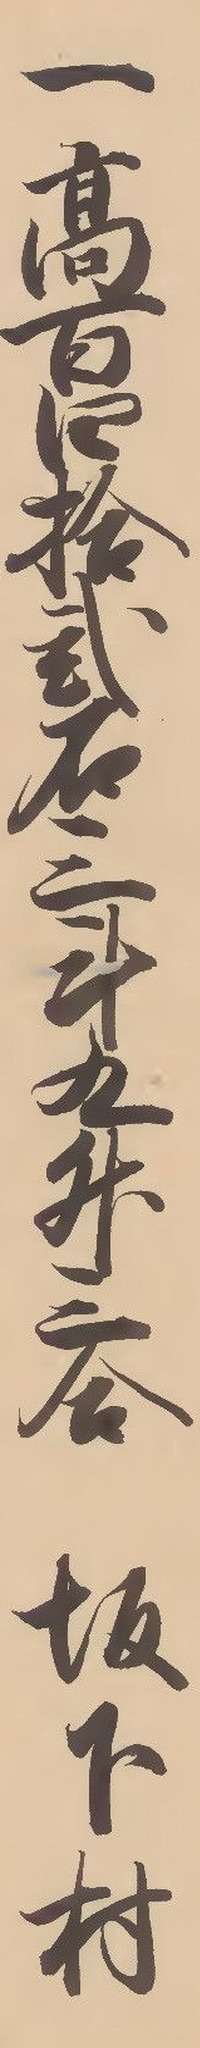一高百四拾弐石三斗九升三合坂下村
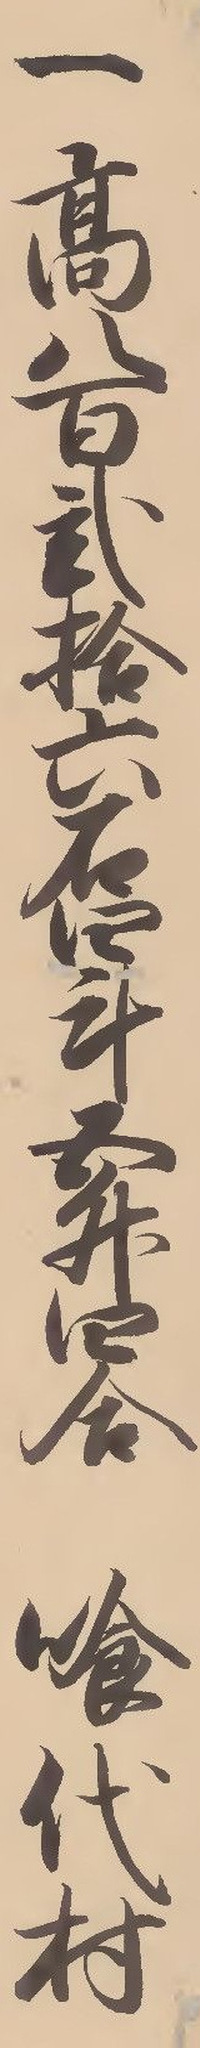一高八百弐拾六石四斗五升四合喰代村
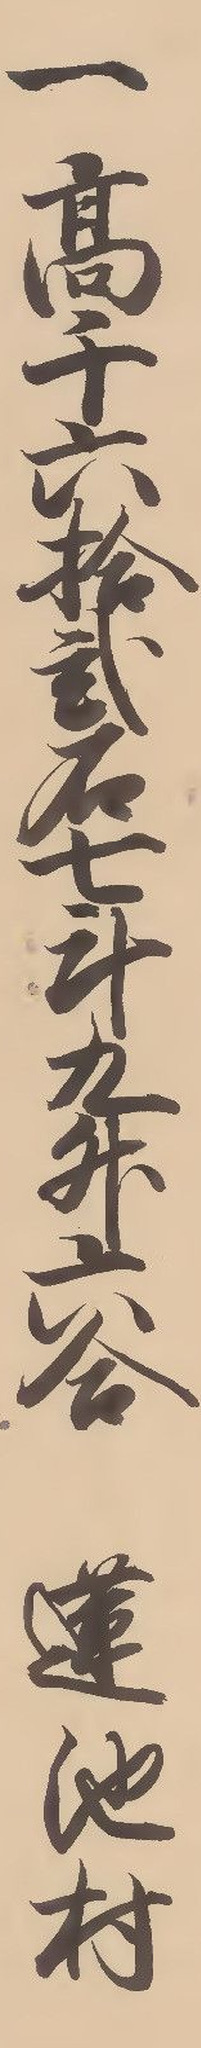一高千六拾弐石七斗九升六合蓮池村
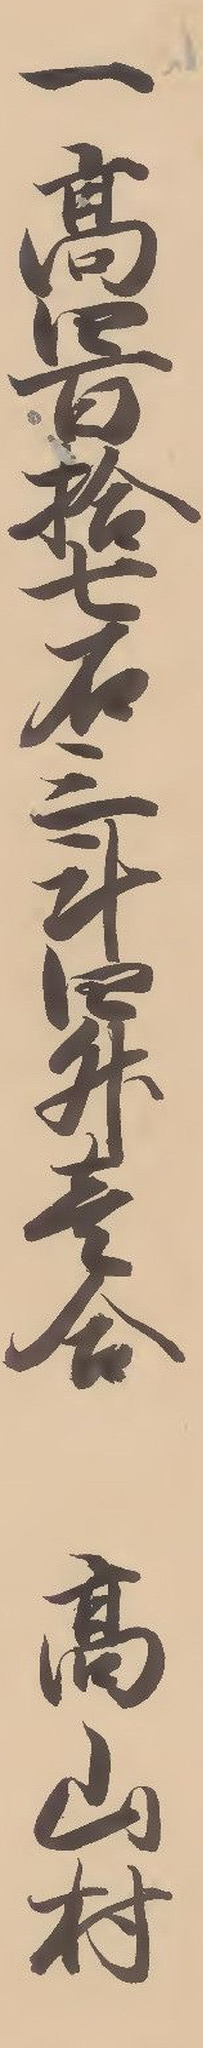一高四百拾七石三斗四升壱合高山村
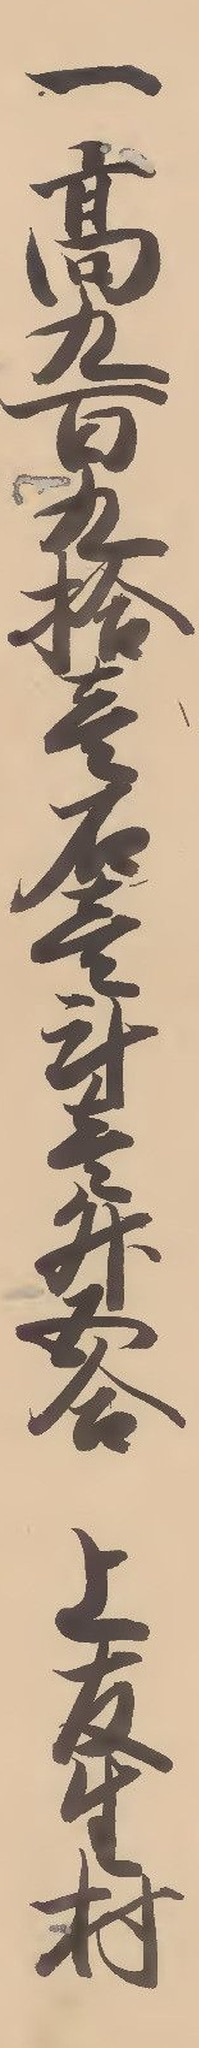一高九百九拾壱石壱斗壱升五合上友生村

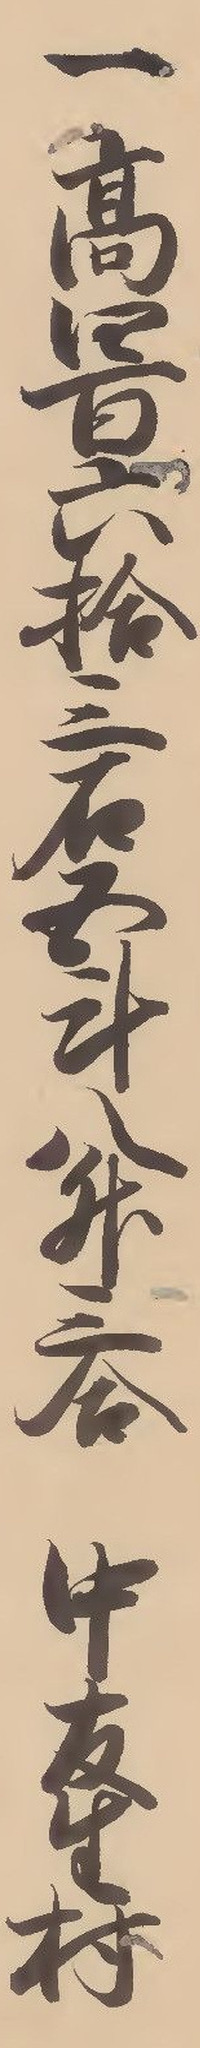一高四百六拾三石五斗八升三合中友生村
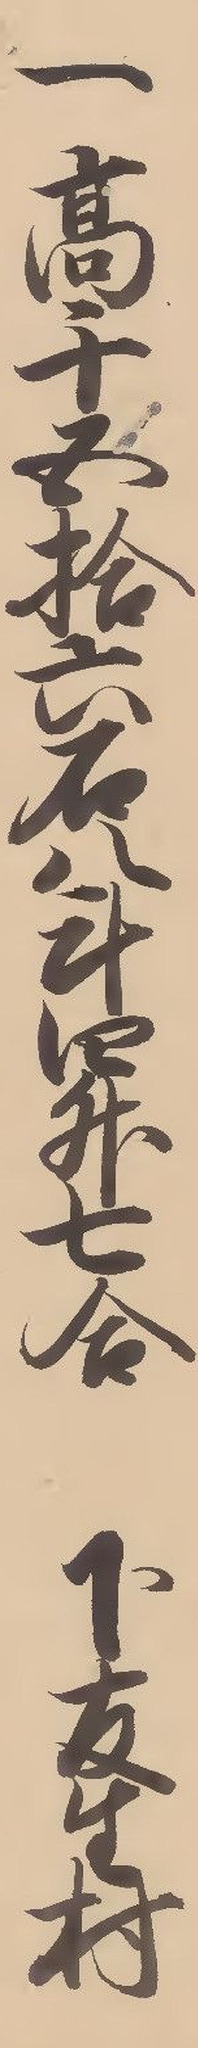一高千五拾六石八斗四升七合下友生村
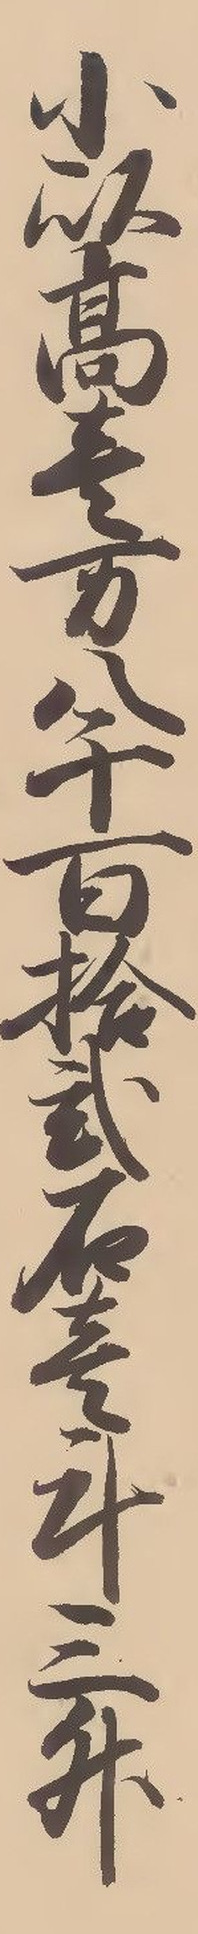小以高壱万八千百拾弐石壱斗三升
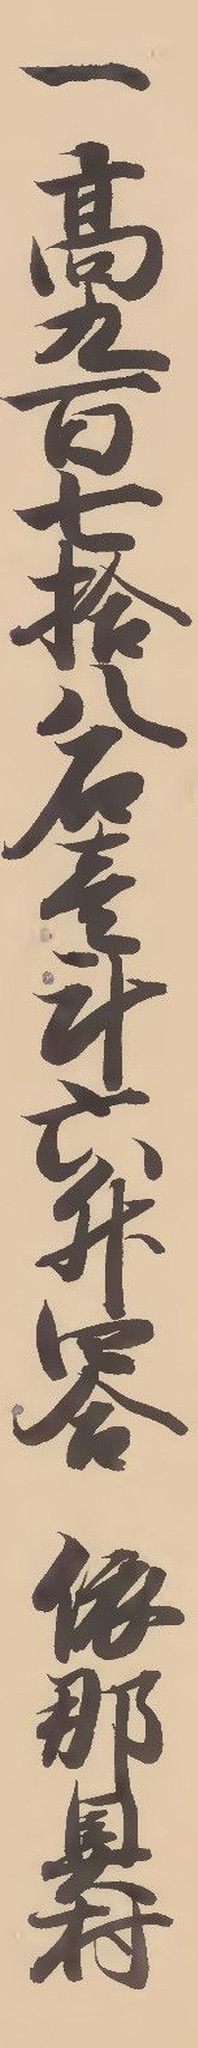一高九百七拾八石壱斗六升四合依那具村
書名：伊賀国郷帳
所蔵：国立公文書館 National Archives of Japan
